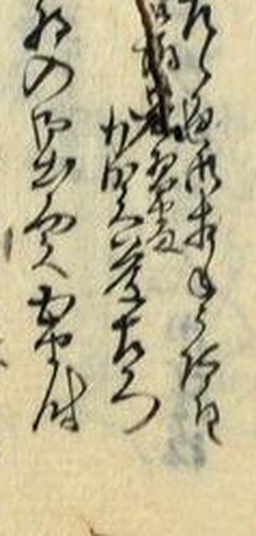加賀藤左衛門
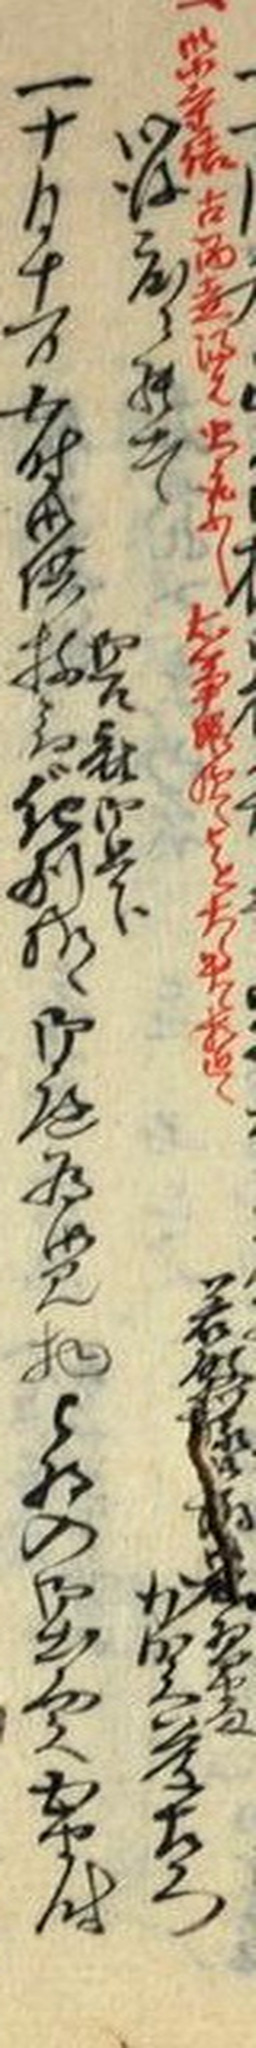一十月十一日五時御供揃ニ而御召麻御上下紀州様へ御庭為御見物被為入御出殿五半時
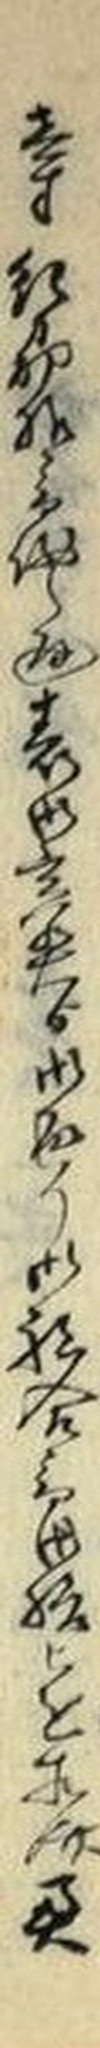壱寸紀州様ニ而例之通表御玄関ゟ御通り御程合ニ而御膳被進相済奥
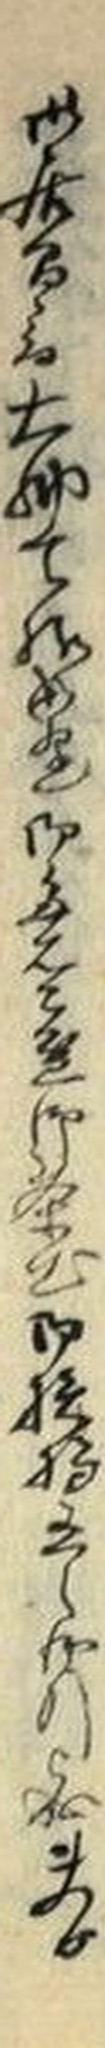御居間ニ而大納言様御逢御たばこ盆御茶出御挨拶有之御引被成夫ゟ
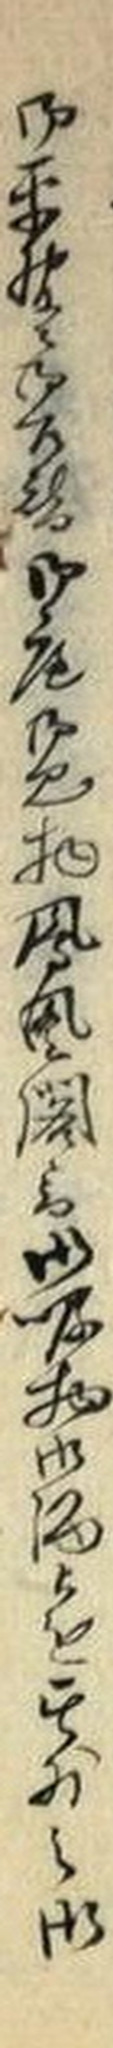御平服ニ御召替御庭御見物鳳凰閣ニ而御吸物御酒被進其外之御
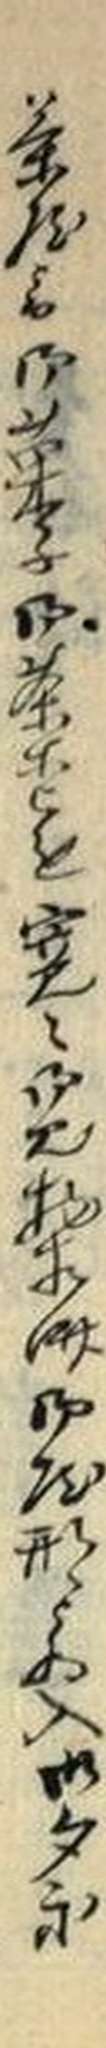茶屋ニ而御菓子御茶等被進寛々御見物相済御屋形へ被為入御夕舟
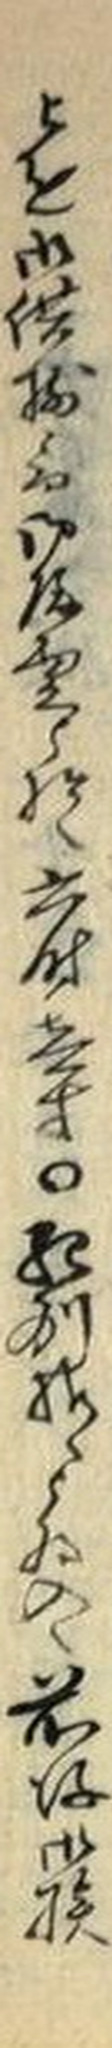被進御供揃ニ而御帰殿被遊候六時壱寸○紀州様へ被為入候前後御挨
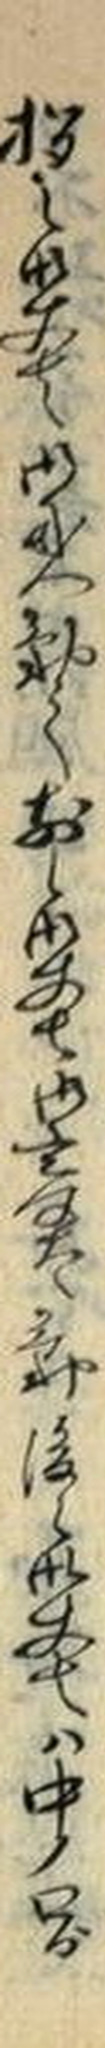拶之御使者御用人勤之前之御使者御玄関へ勤後之御使者ハ中之口ゟ

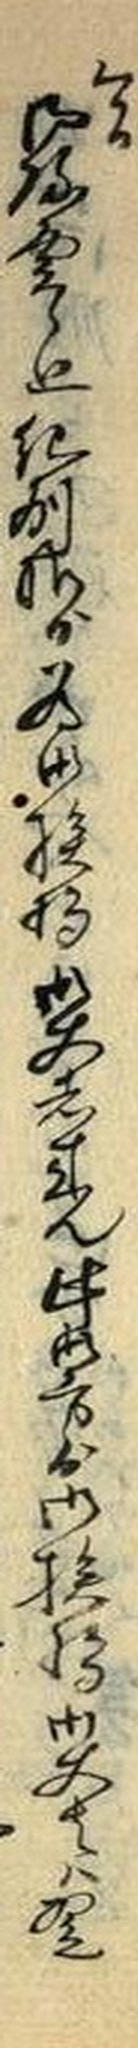今日御帰殿之上紀州様ゟ為御挨拶御使者来ル此御方ゟ御挨拶御使者ハ翌
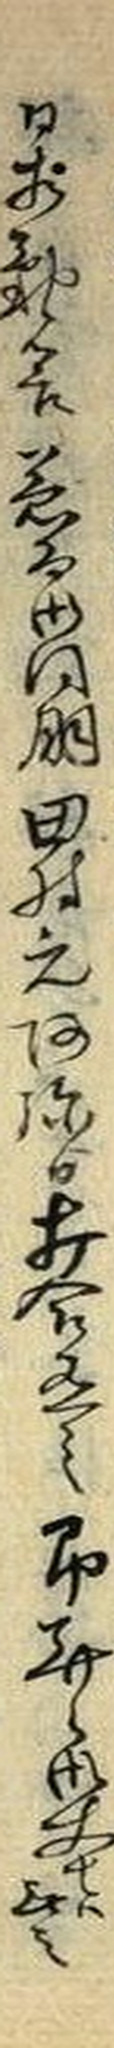日相勤候筈兼而御同朋田村元阿弥ゟ打合有之即刻之御使者ハ無之
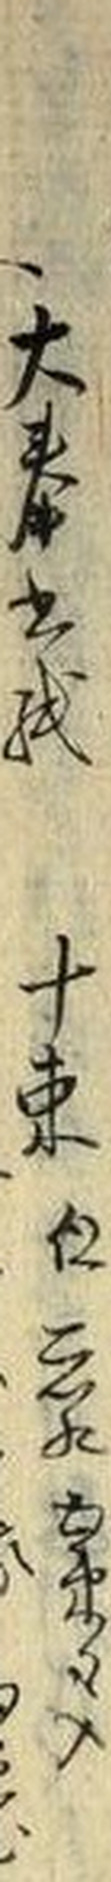大奉書紙十束但二箱五束ツヽ入
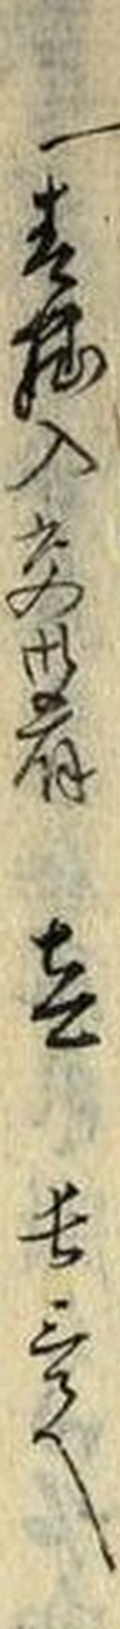青籠入交御肴壱長三尺
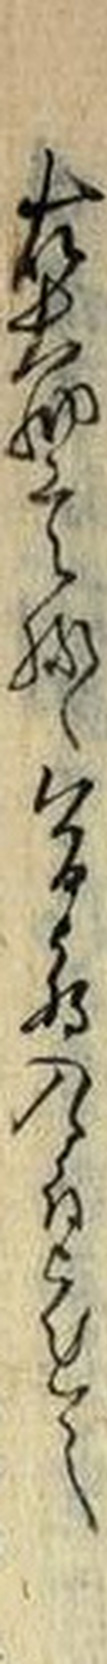右大納言様へ今日被為入候ニ付被進之
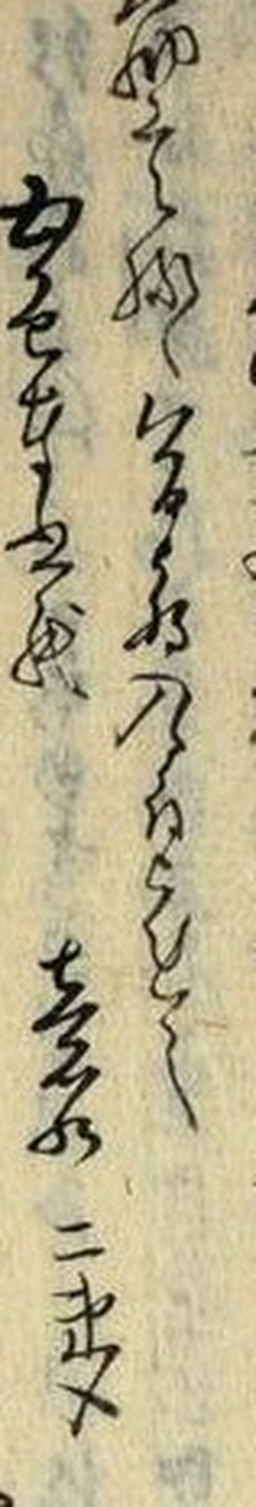五色奉書紙壱箱二束入
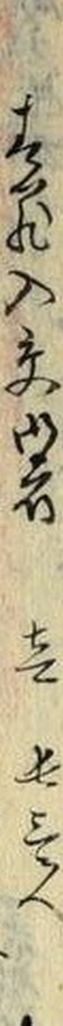青籠入交御肴壱長三尺
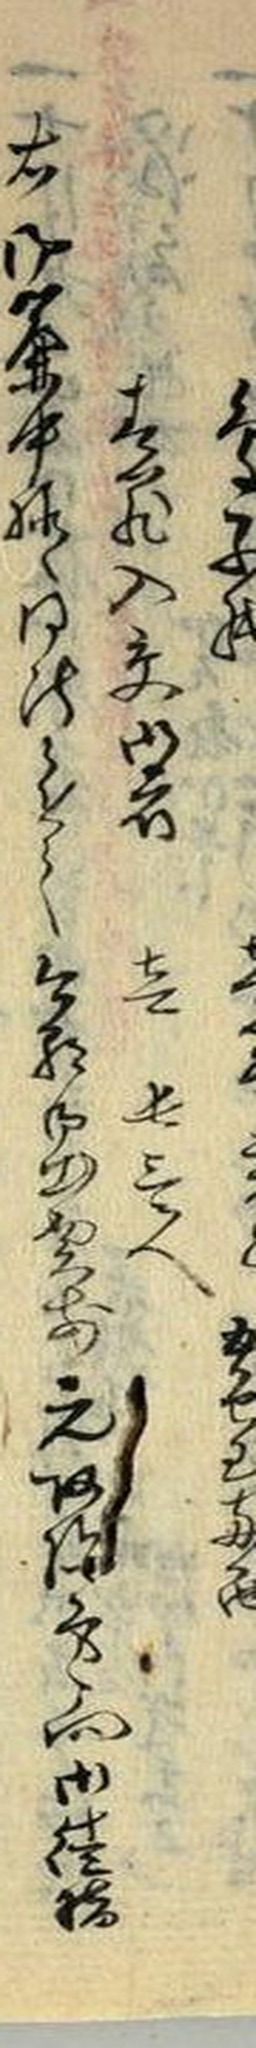右御簾中様へ同断被進之今朝御出殿前元阿弥方へ向御徒指
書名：少傅日録抄（斉承付側向頭取日記、在府）
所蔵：福井県文書館 Fukui Prefectural Archives
